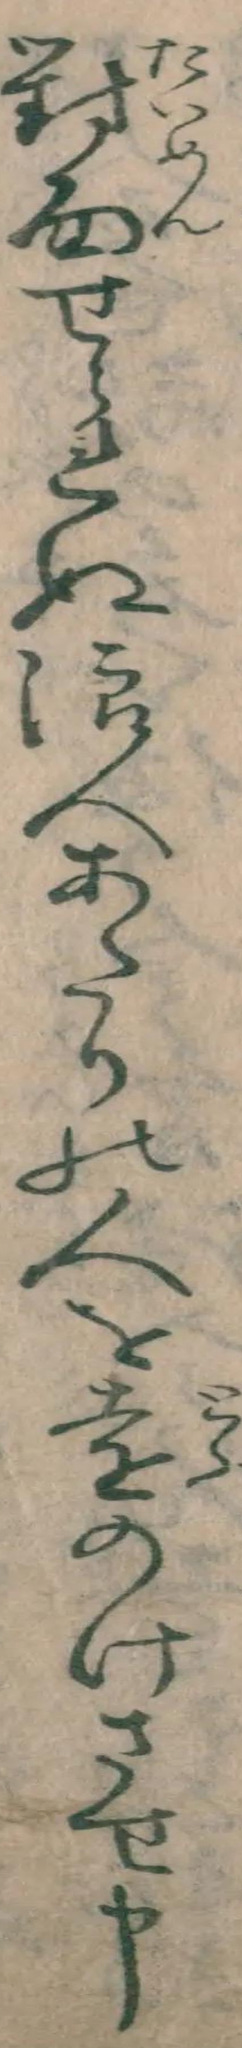対面せられぬ浪人あたりの人を遠のけさせ申
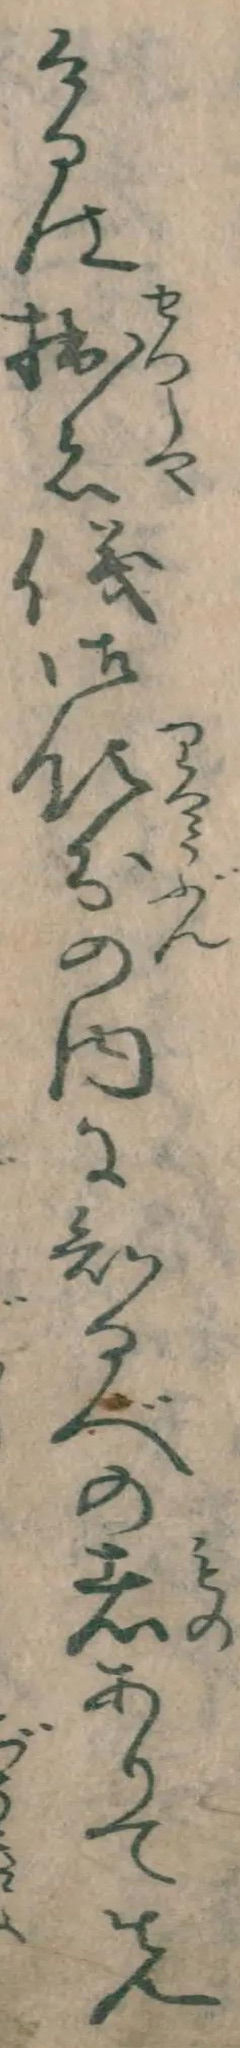けるは拙者儀御領分の内にしるべの者ありて先
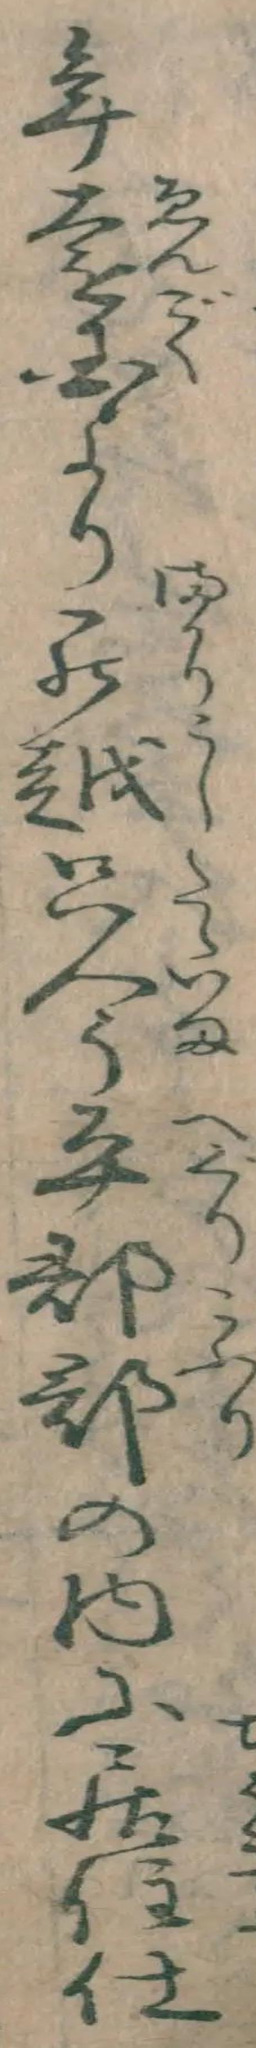年遠国より罷越只今平郡郡の内に住居仕

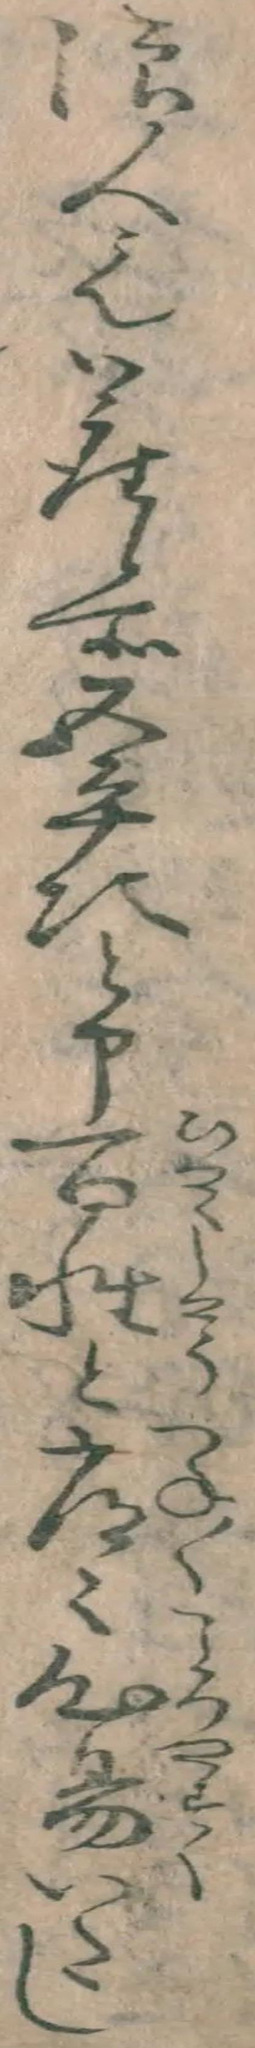浪人にて御座候所五平次と申百姓と常々心易いたし
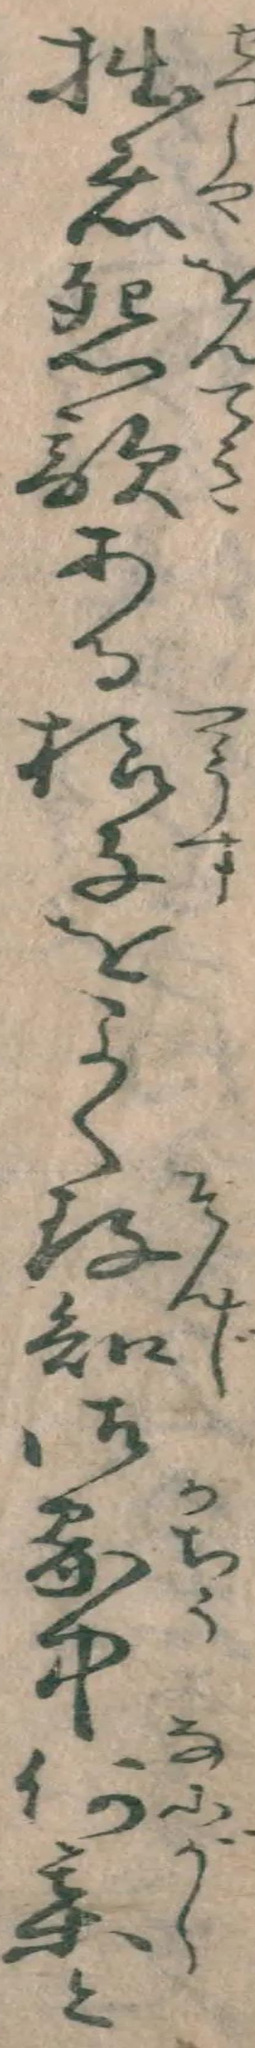拙者怨敵ある様子をよく存知御家中何某と
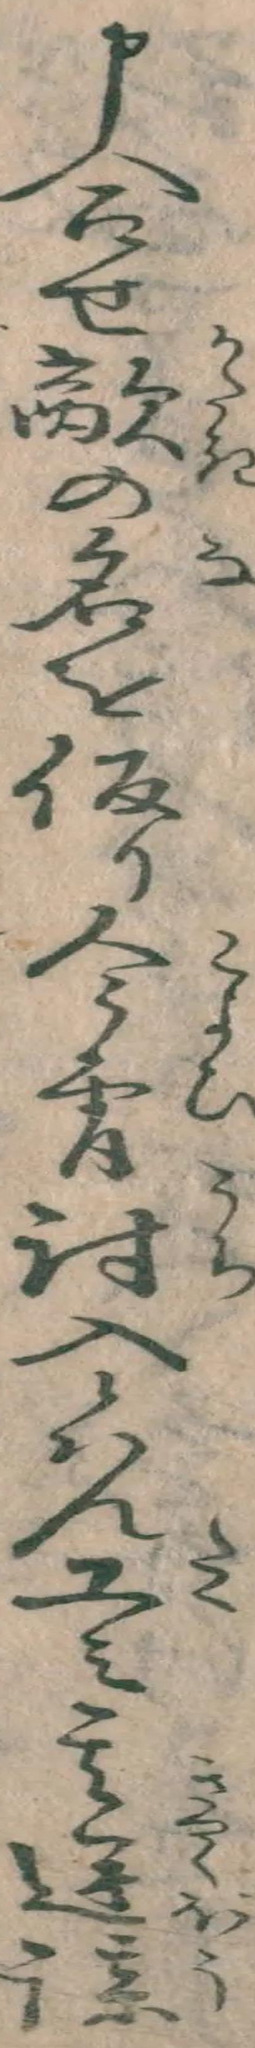申合せ敵の名を仮り今宵討入候はん工み其逆某
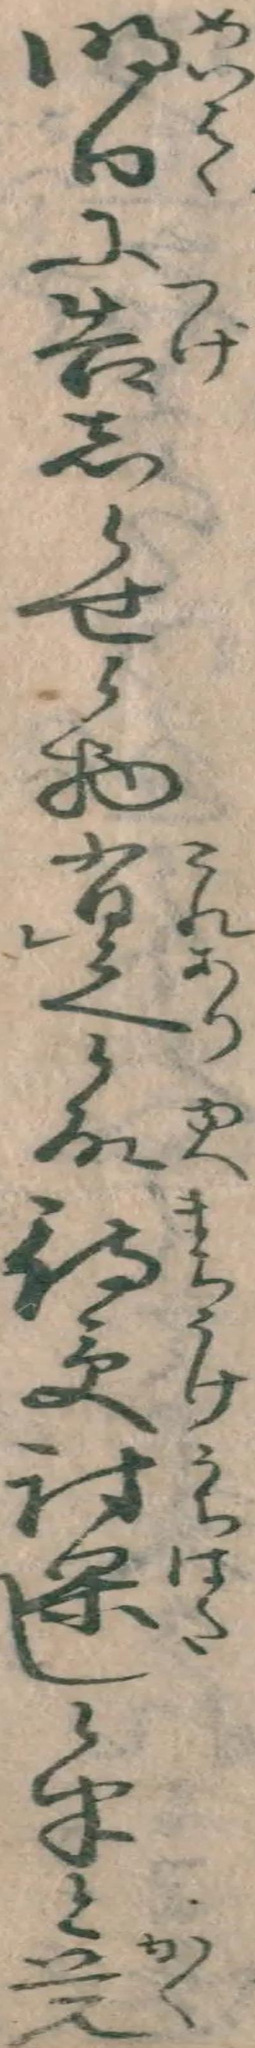明白に告しらせ候物有之候故待受討果し候半と覚
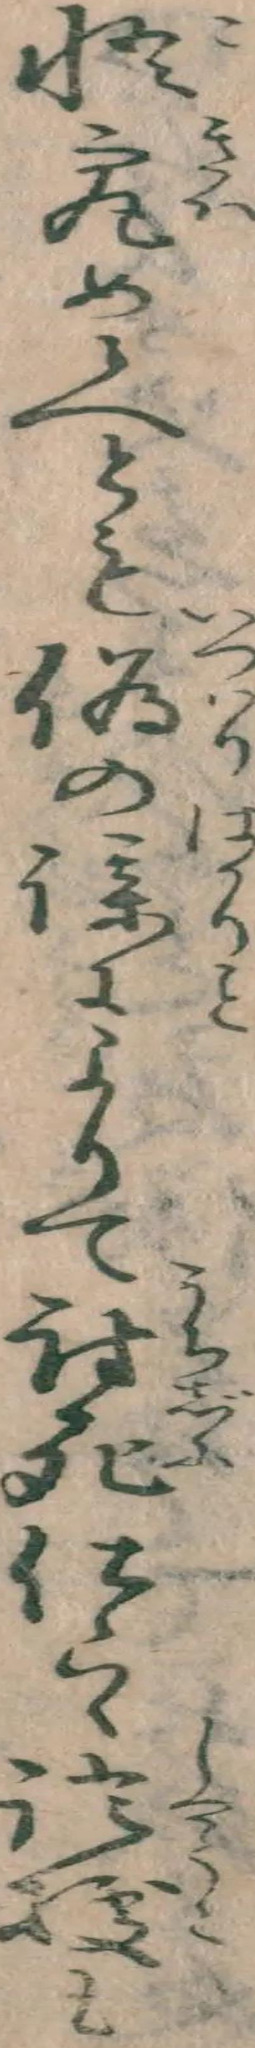悟究め候へとも偽の謀によりて討死仕候はゝ証拠も
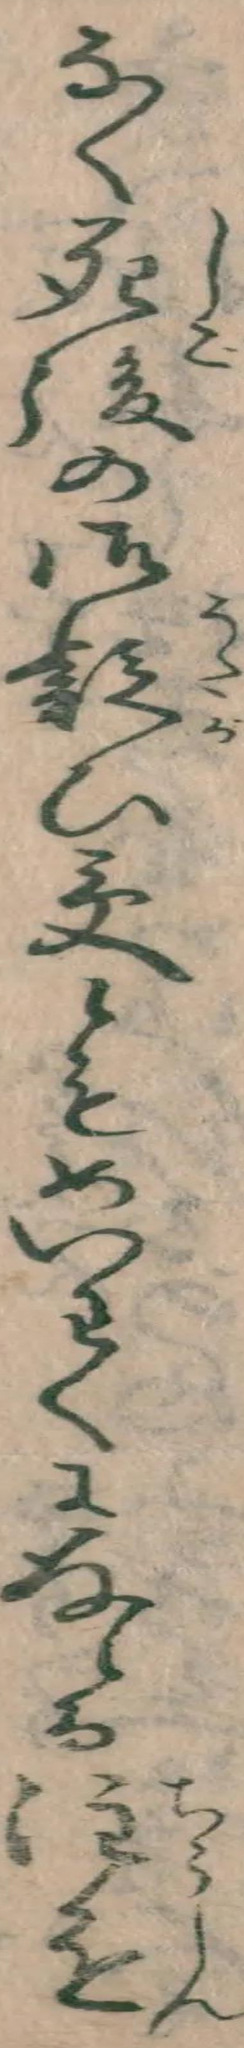なく死後の御疑ひ受候もめいわくに存候て注進
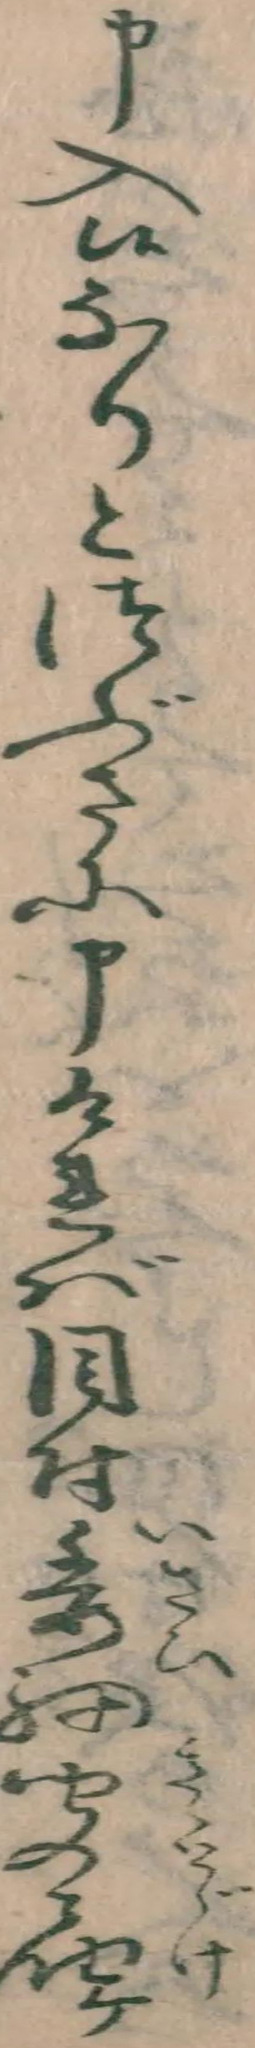申入候なりとつぶさに申ければ目付委細聞届
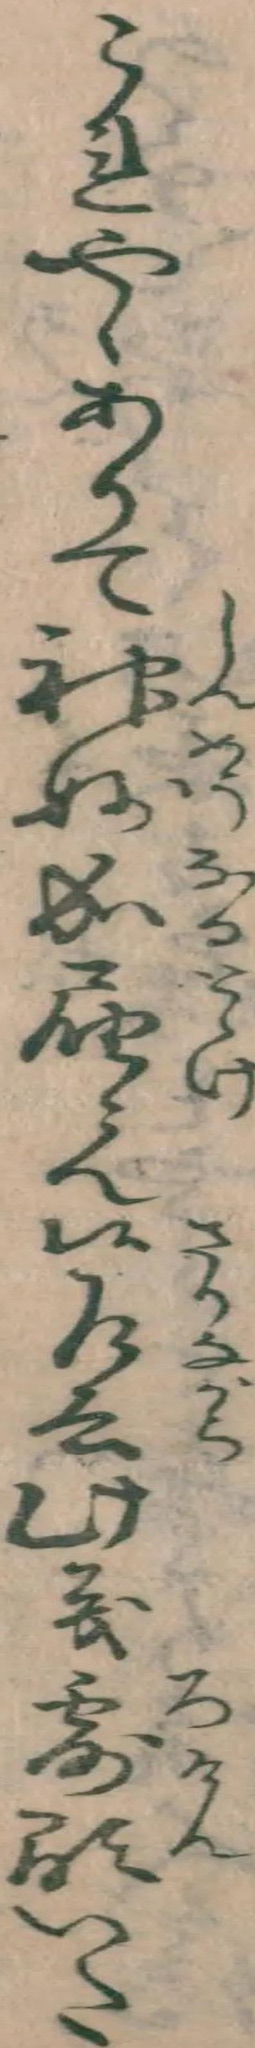これやゝありて神妙成届にて候乍去此義露顕いた
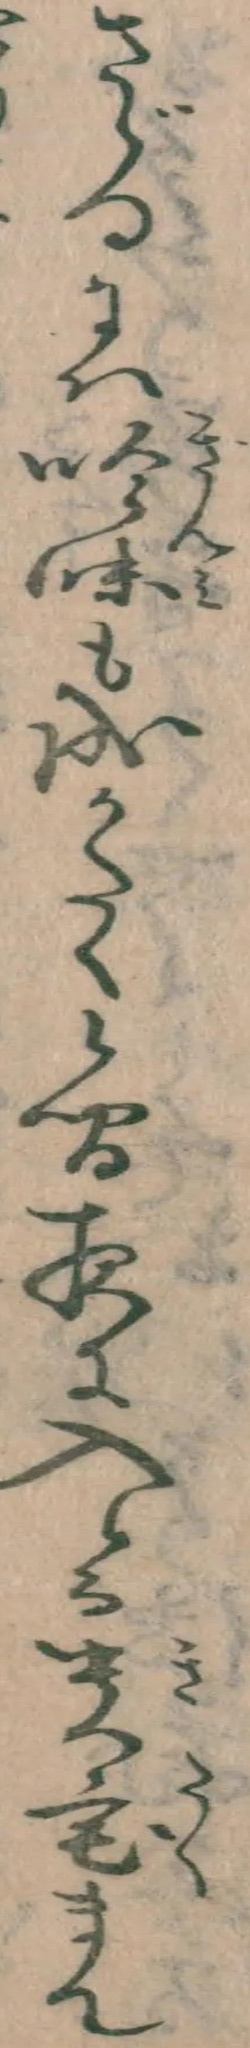さゞるには吟味も成かたく候間夜に入候て貴宅まて
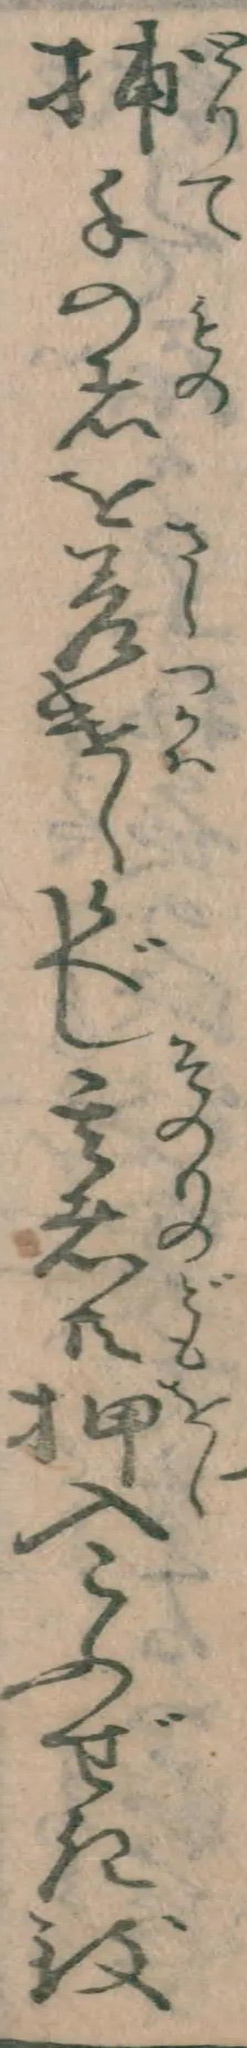捕手の者を差遣し候べし其者共押入らふぜき致
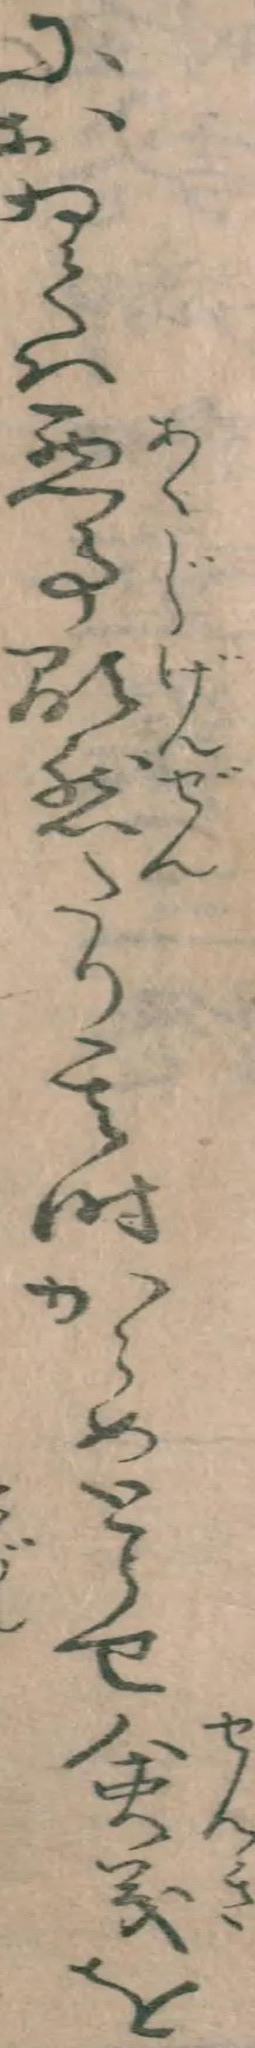におゐては悪事顕然たり其時からめとらせ僉義を
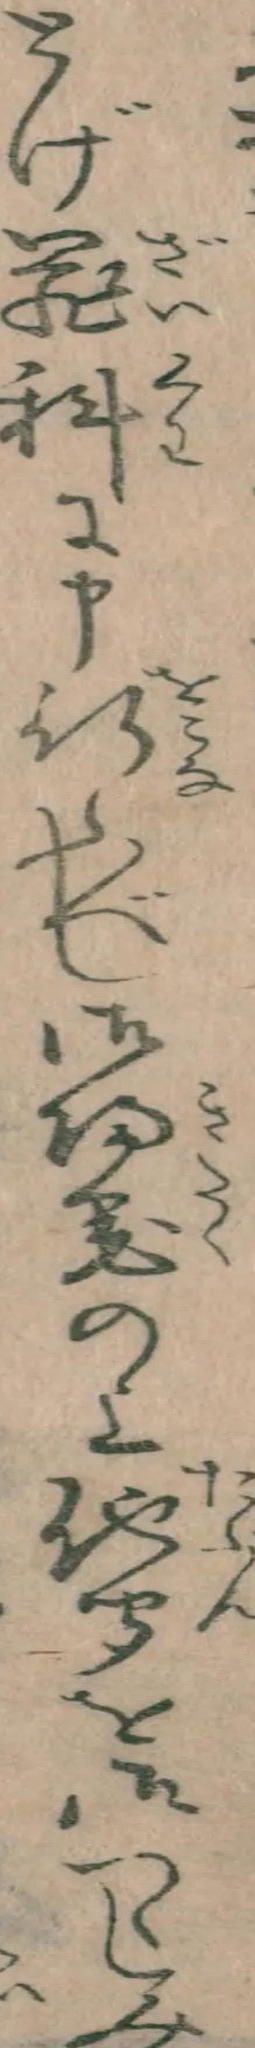とげ罪科に申行ふべし御帰宅の上他聞を御つゝしみ
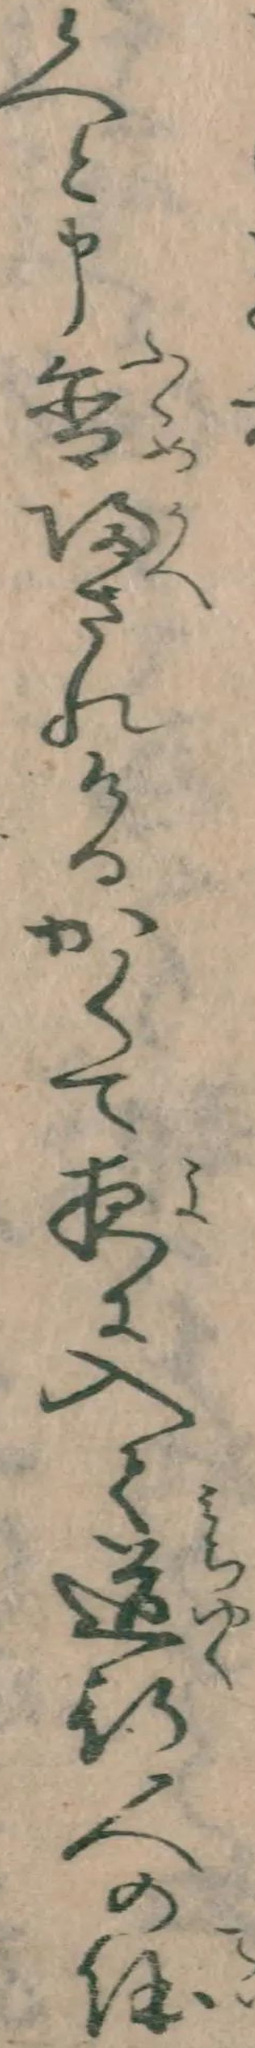候へと申含帰されけるかくて夜に入て道行人の体
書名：怪談御伽童 5巻. [2]
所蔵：国立国会図書館 National Diet Library, JAPAN
